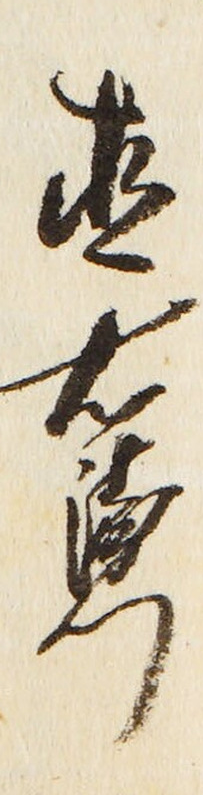直右衛門

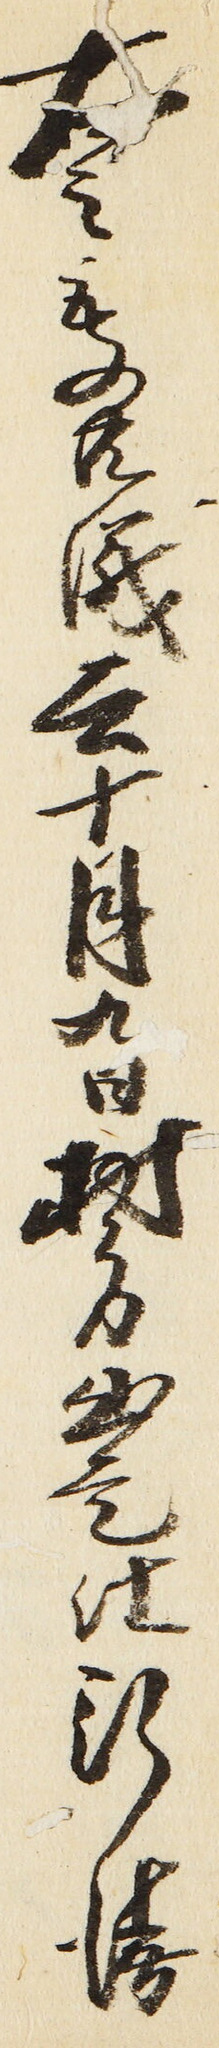右之もの共儀去十月九日村方出走仕行衛
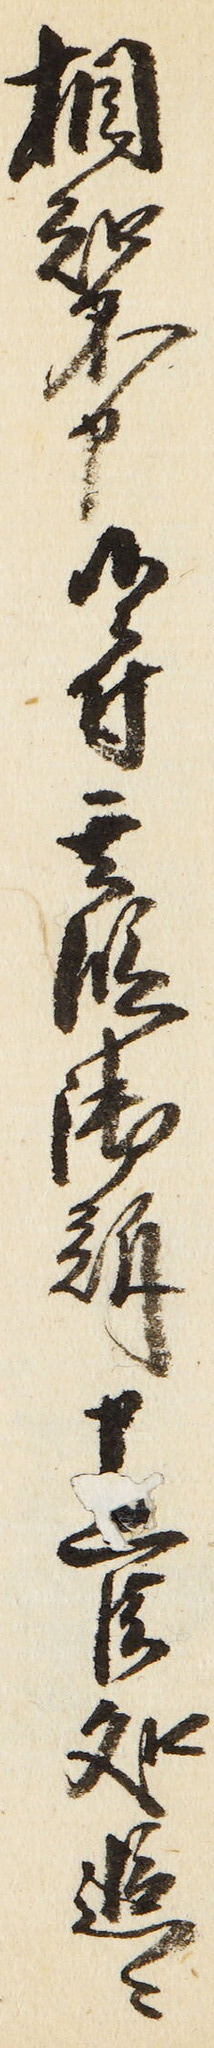相知不申候ニ付其段御訴申上候処追々
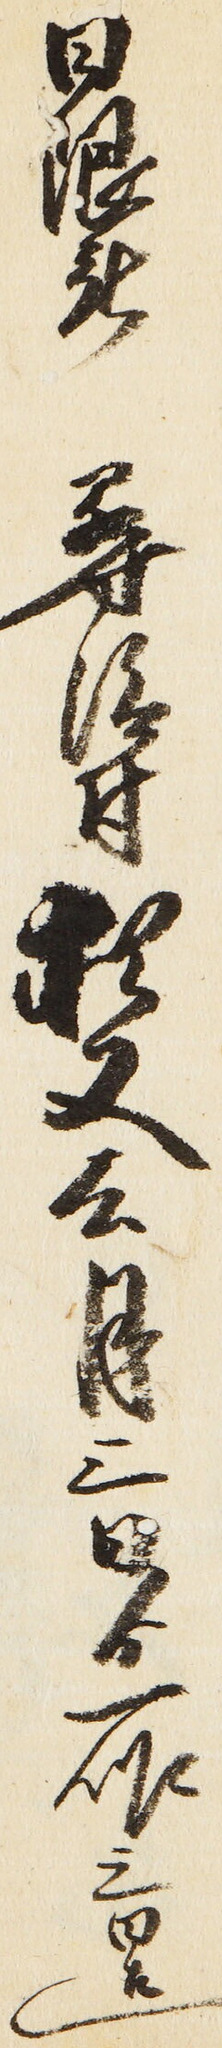日限被尋仰付猶又去月三日ゟ一昨三日迄
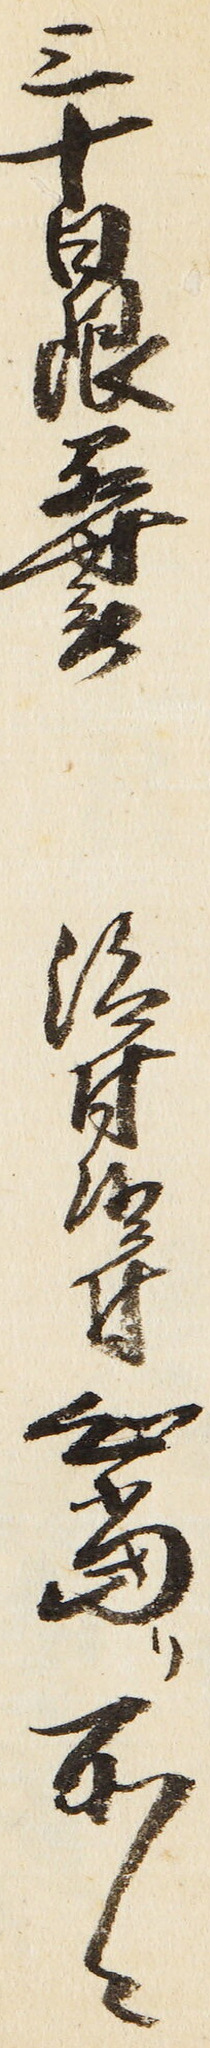三十日限尋被仰付候ニ付心当り所々
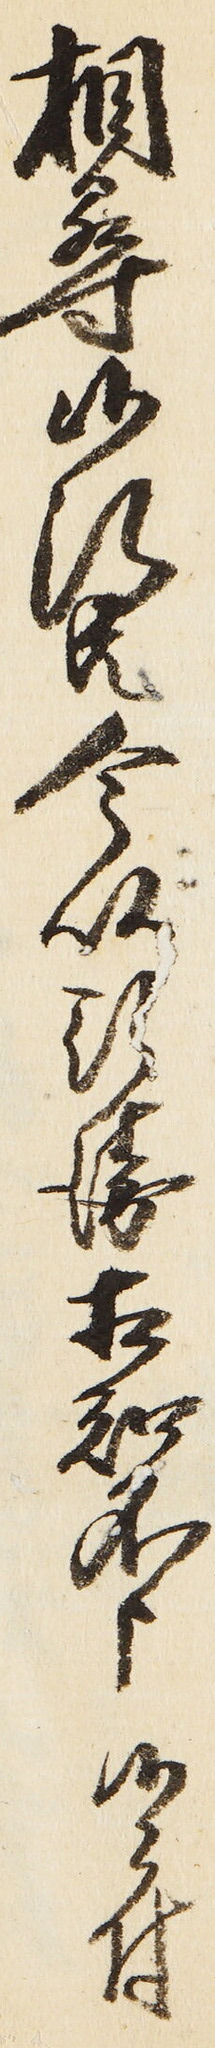相尋候得共今以行衛相知不申候ニ付
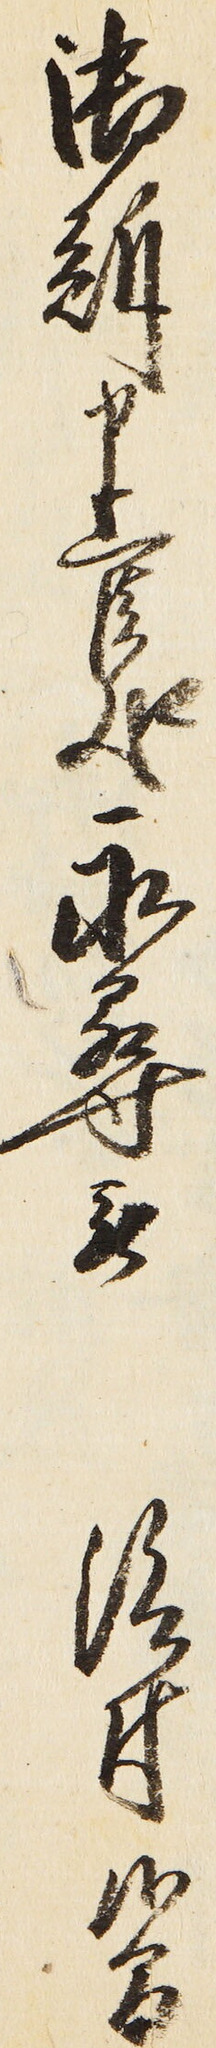御訴申上候処永尋被仰付候間
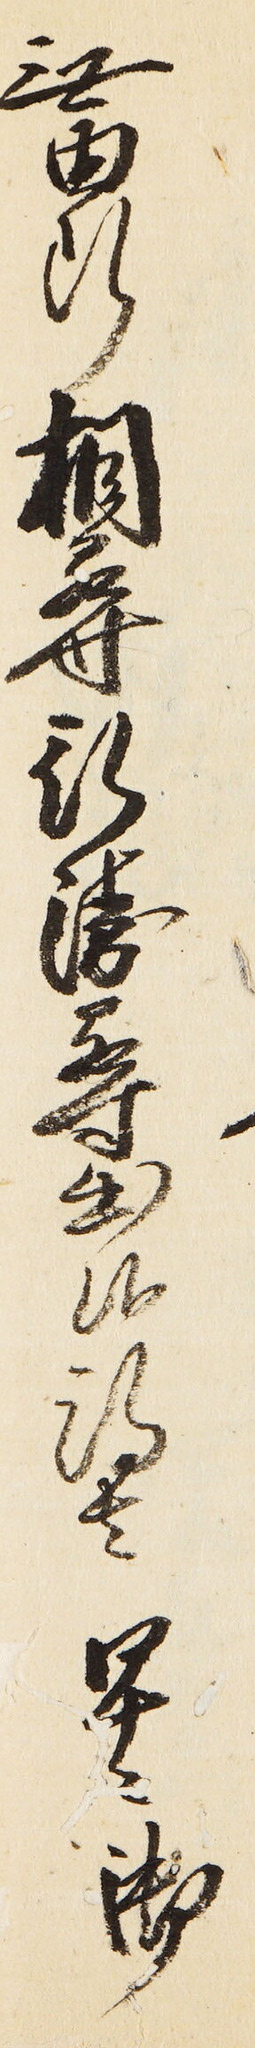無由断相尋行衛尋出候得者早々御
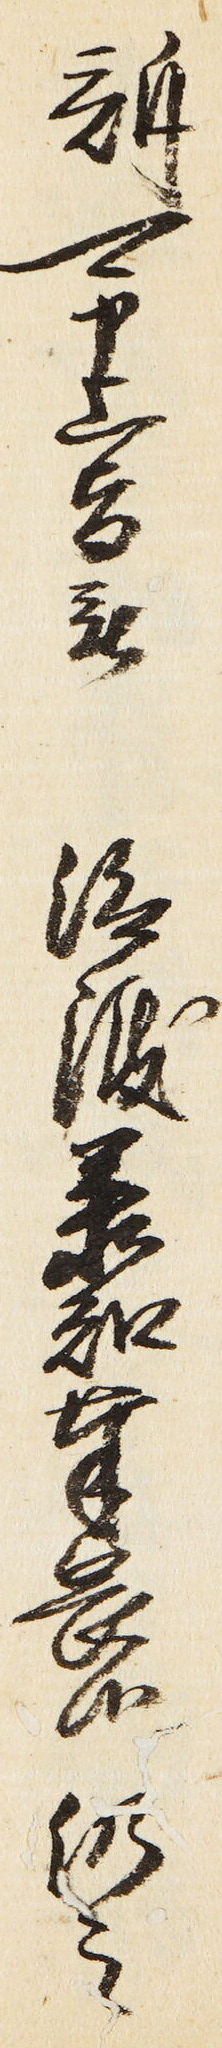訴可申上旨被仰渡承知奉畏候依之
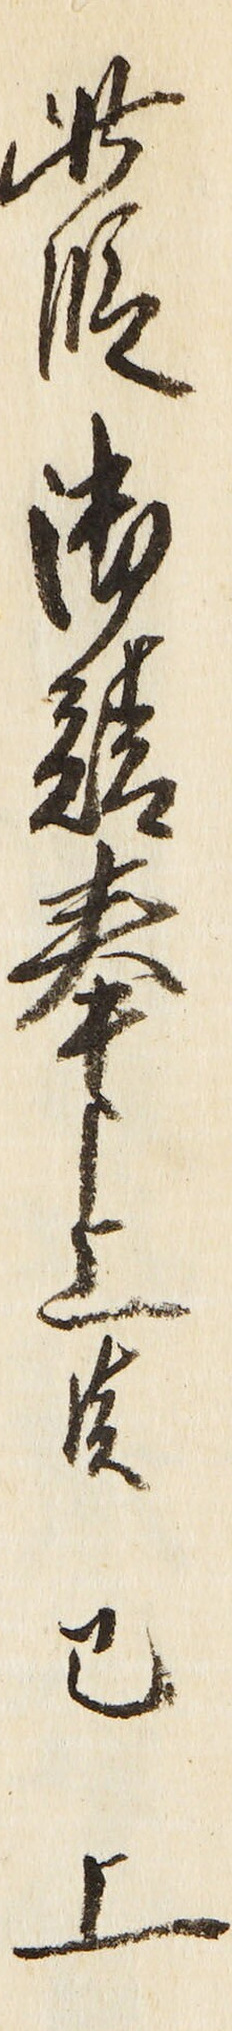此段御請奉申上候已上
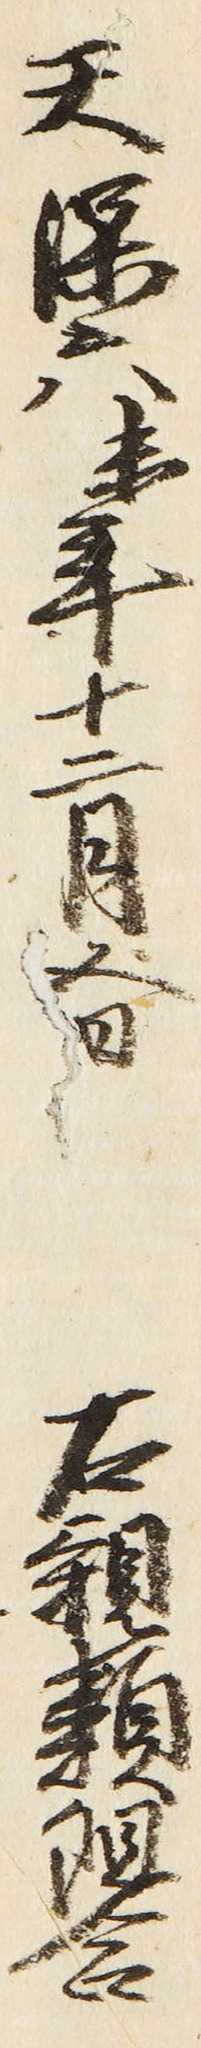天保六未年十二月五日右親類組合
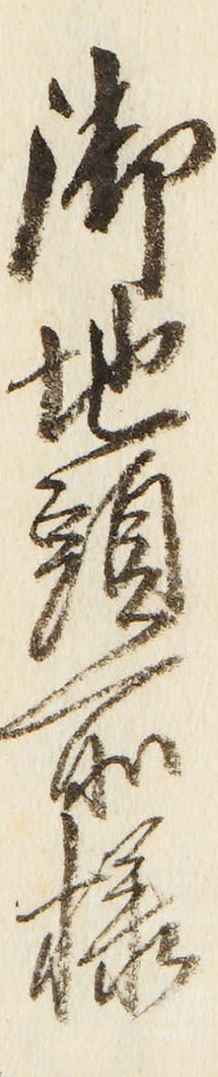御地頭所様
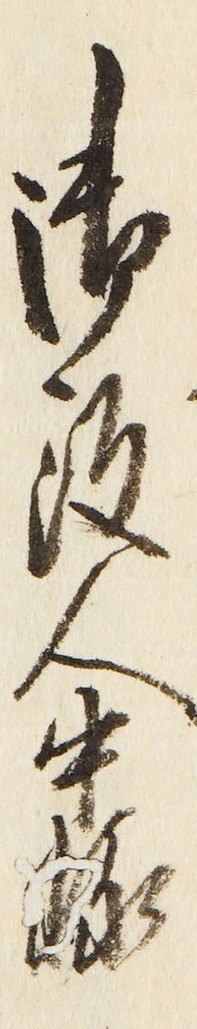御役人中様
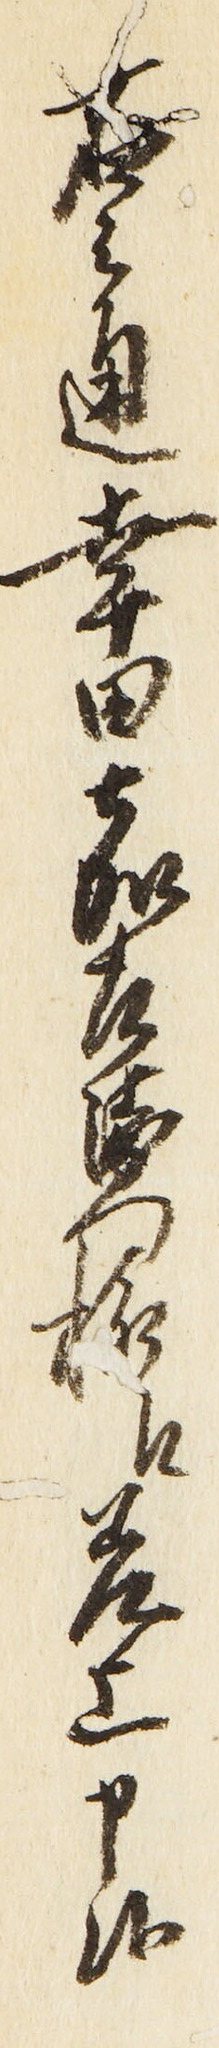右之通幸田嘉左衛門様江差上申候

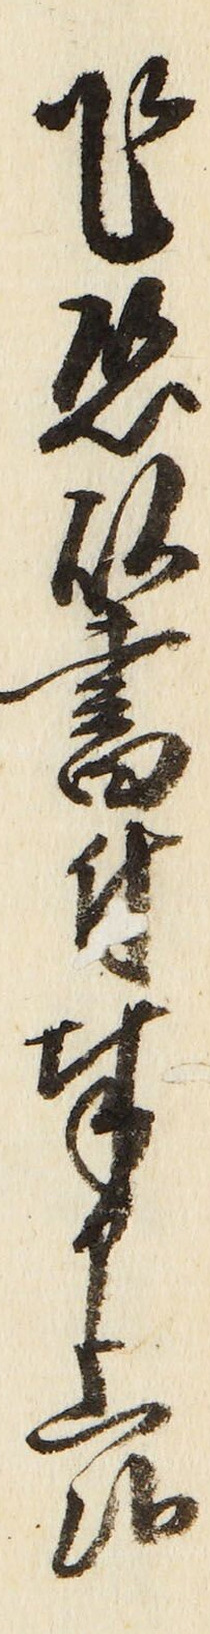乍恐以書付奉申上候
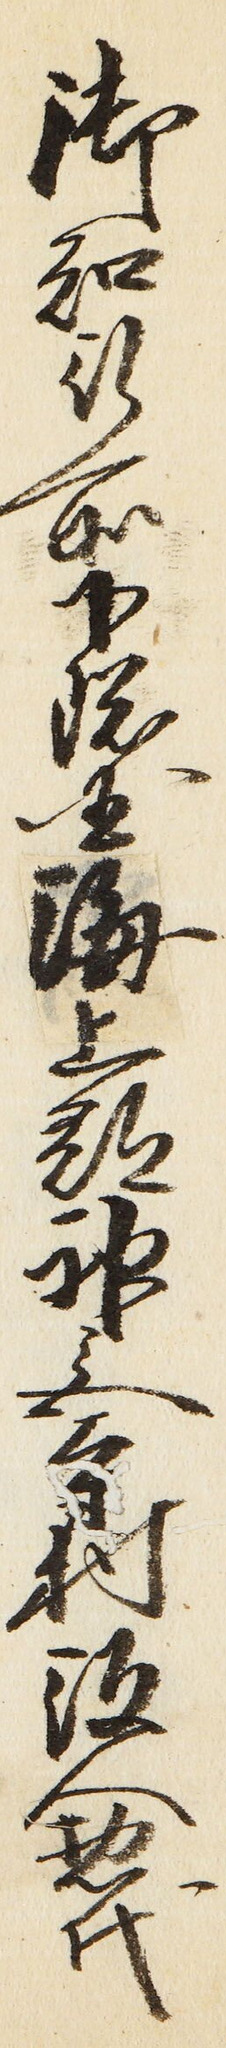一御知行所下総国海上郡神宮寺村役人惣代
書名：難船一件記録
